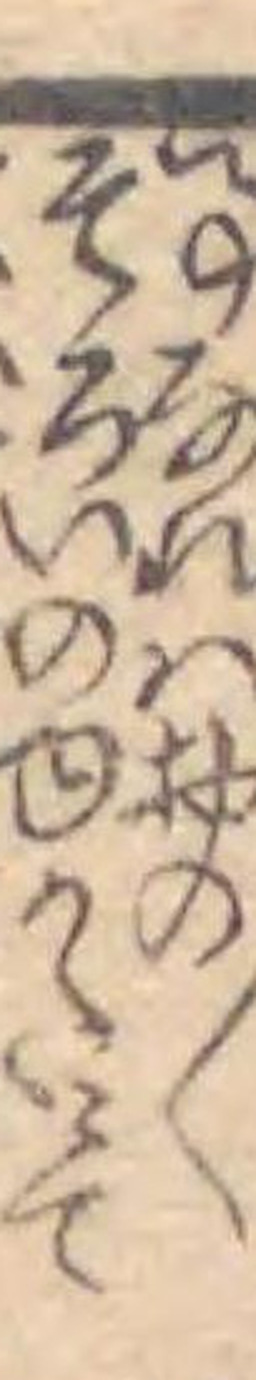そろいのゆかたにて
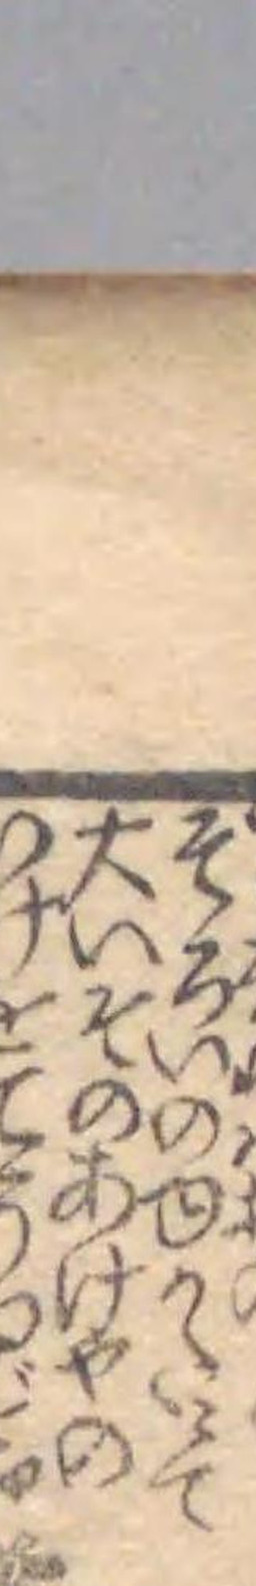大いそのあけやの
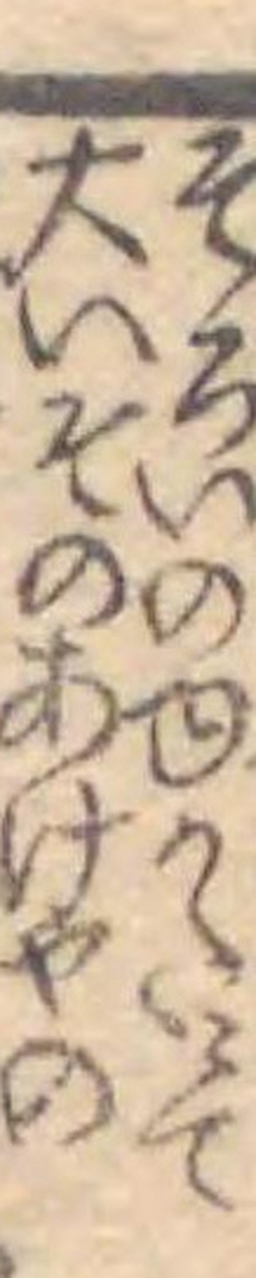大いそのあけやの
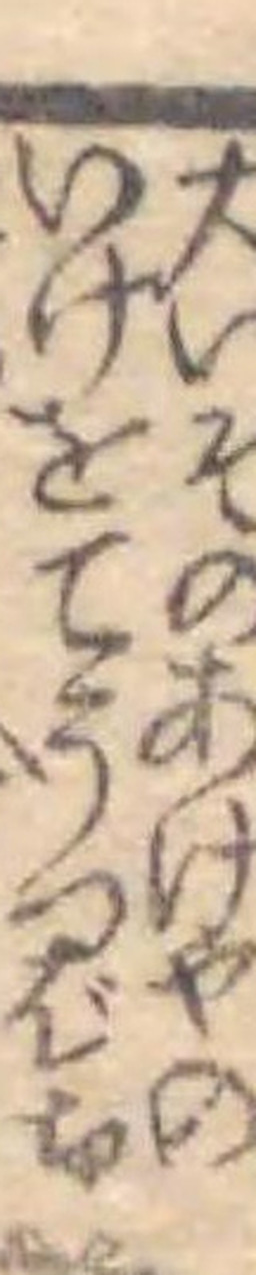いけをてうづばち
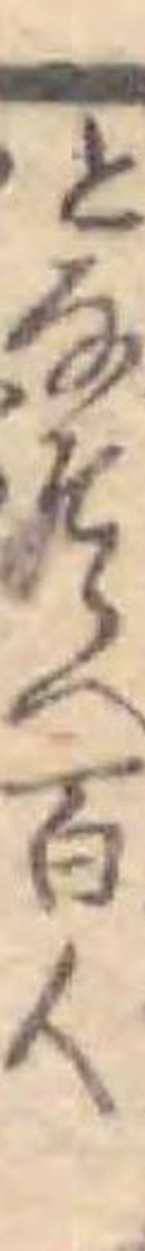となそらへ百人
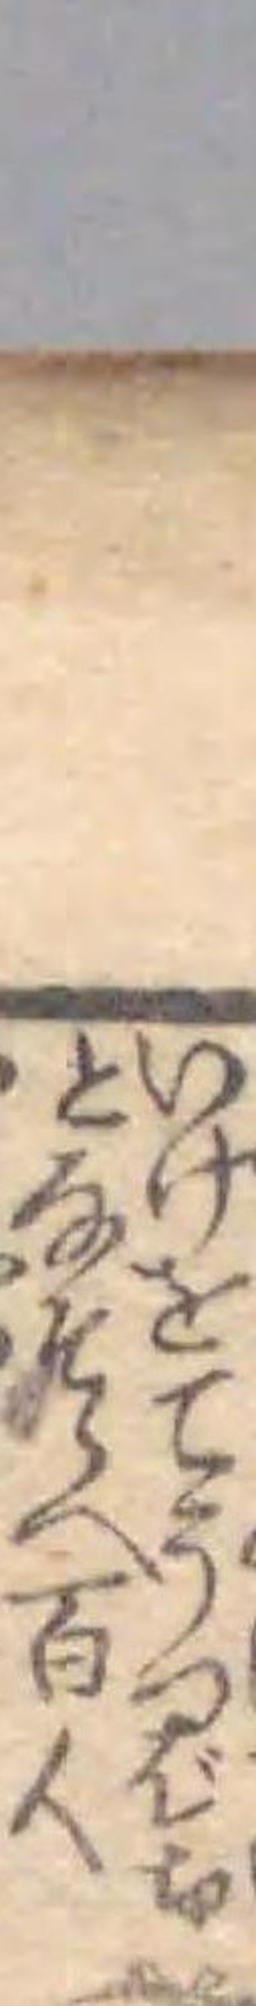となそらへ百人
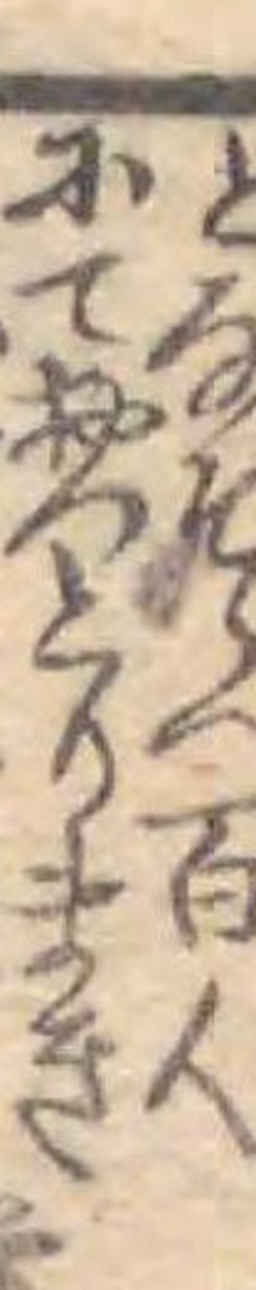にておつとりまき
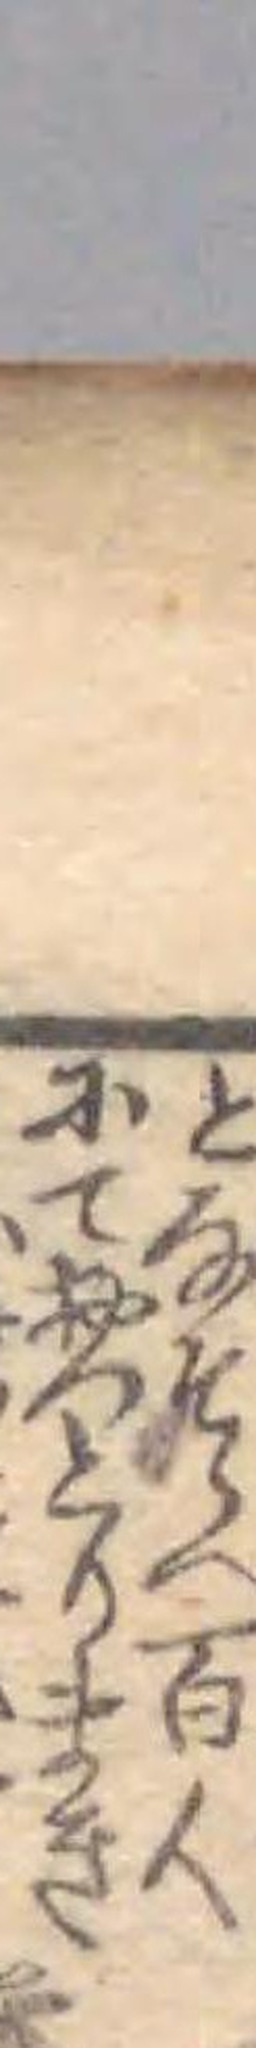にておつとりまき
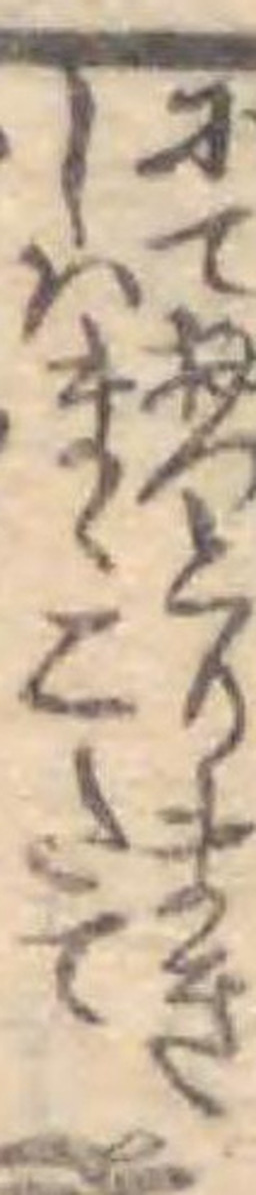しはまゝこたて
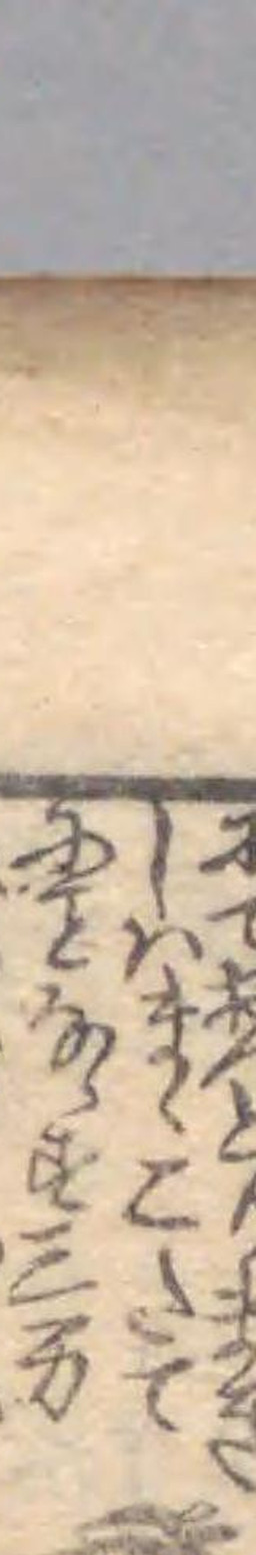にことならす三万
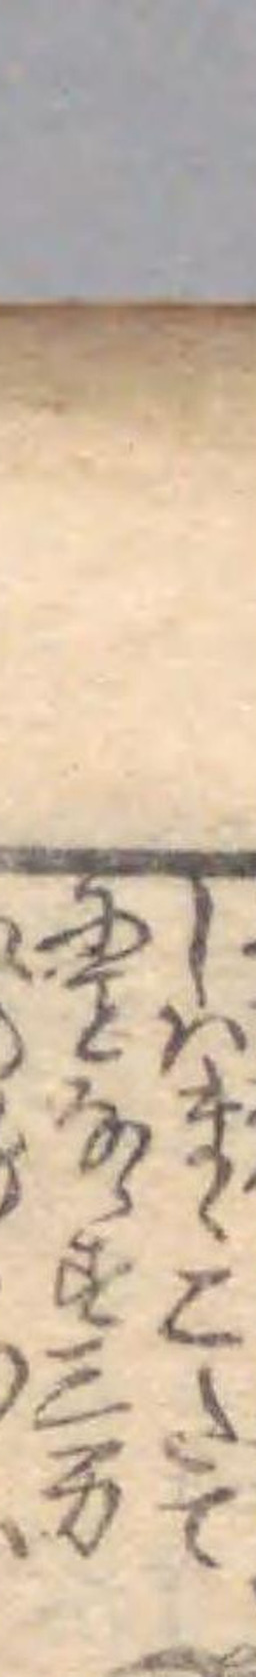にことならす三万
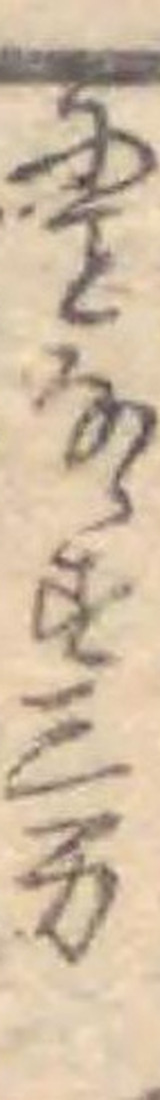にことならす三万
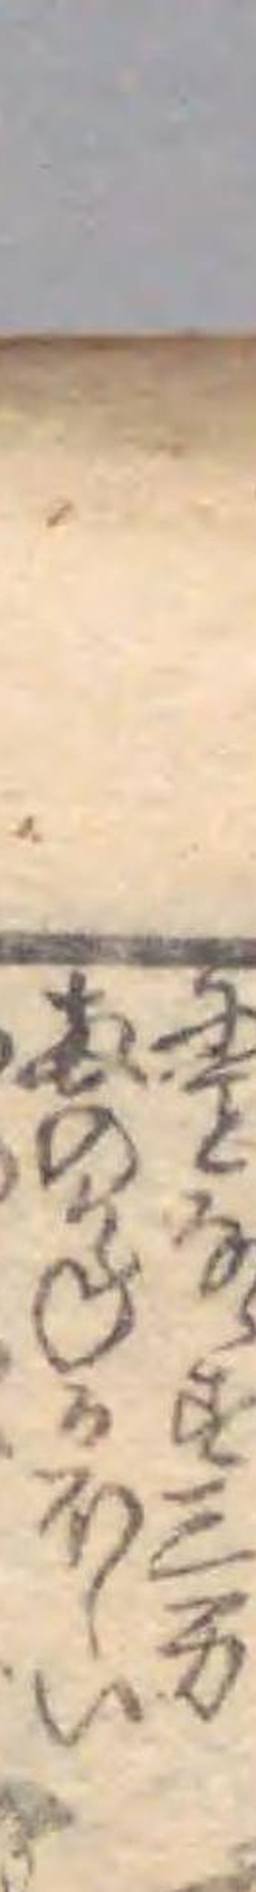両のかねかほしい
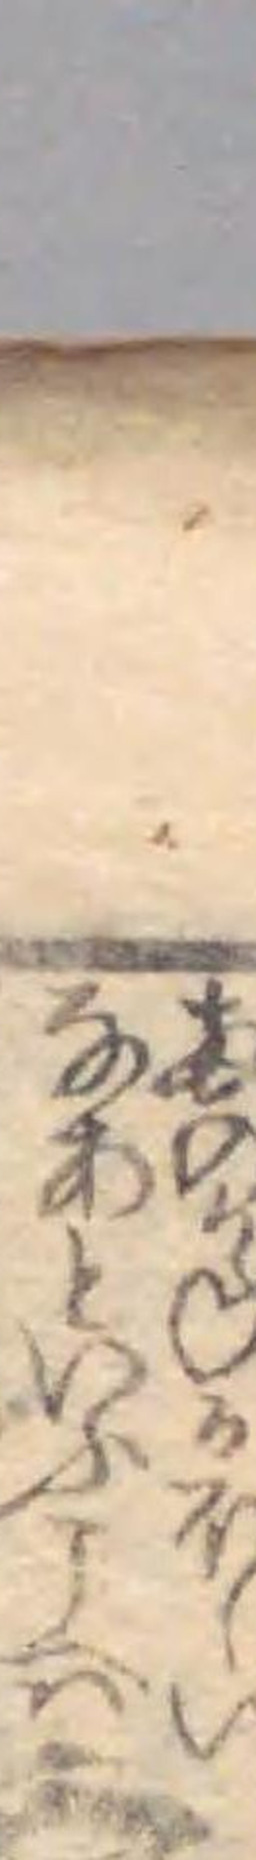なあといふこへは
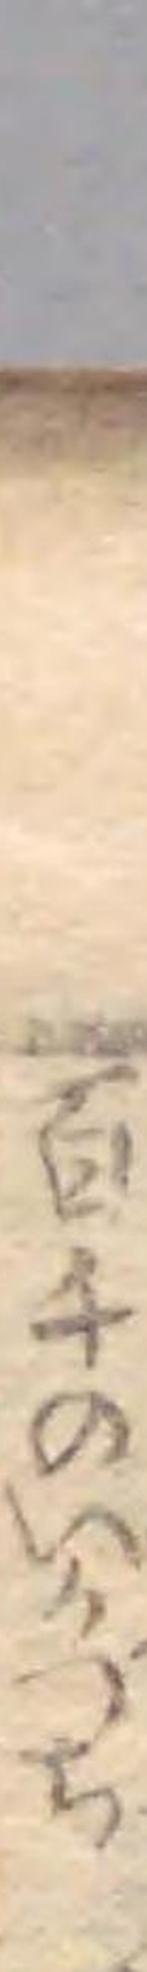百千のいかつち
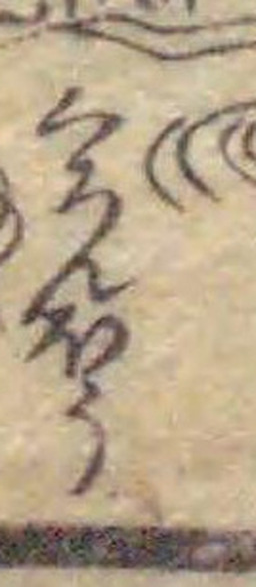くろんほう
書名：文武二道万石通 : 3巻
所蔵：国立国会図書館 National Diet Library, JAPAN
